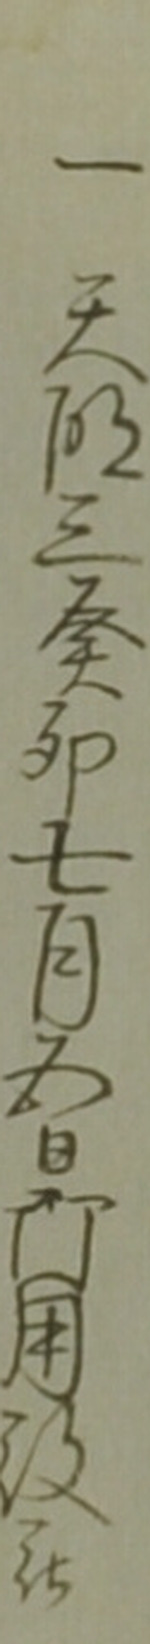一天明三癸卯七月五日御用役被
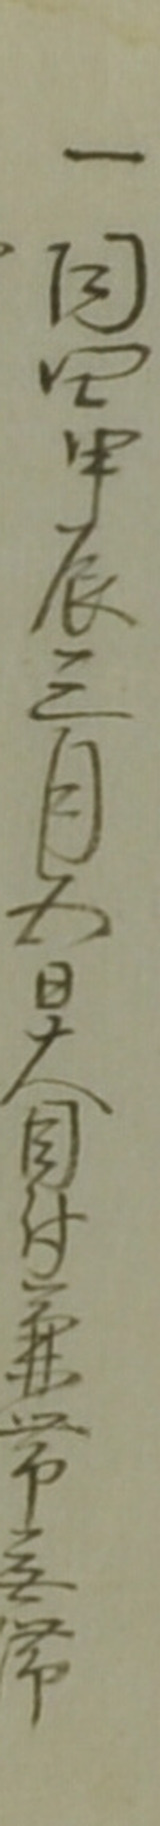一同四甲辰三月五日大目付兼帯無滞
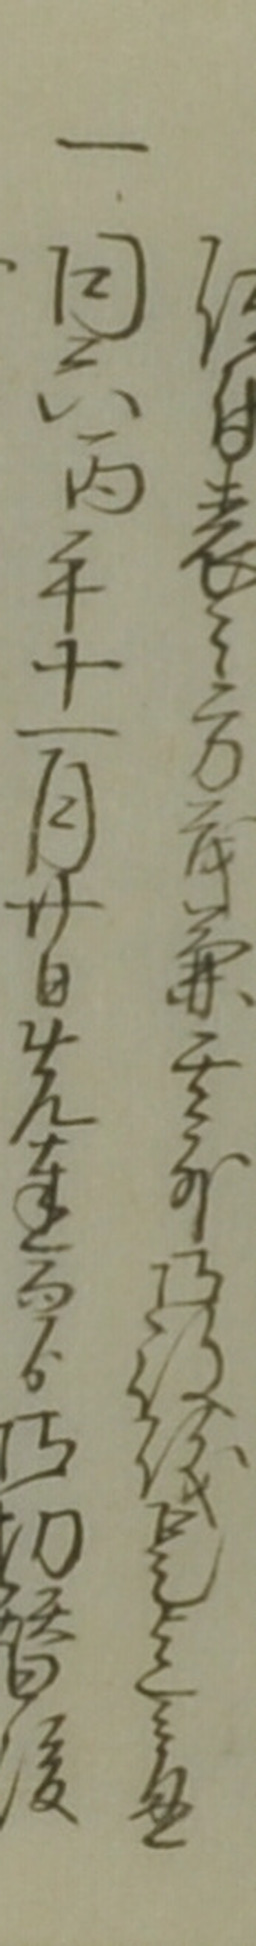一同六丙午十一月廿日先達而ゟ御切替後
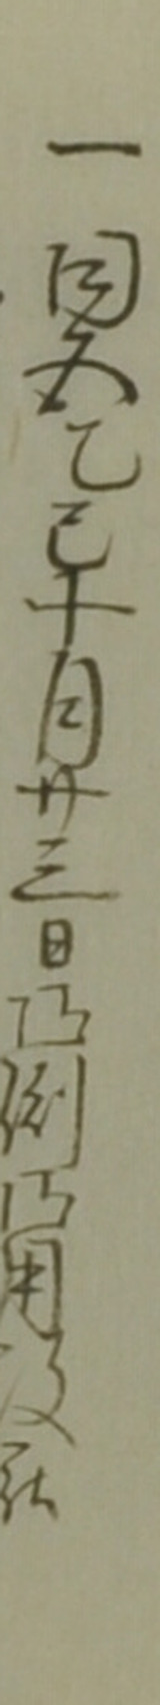一同五乙巳十月廿三日御側御用役被
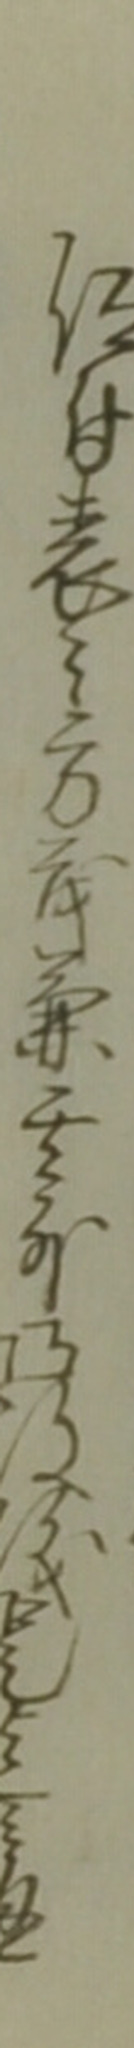仰付表之方茂兼其外御役儀是迄之通
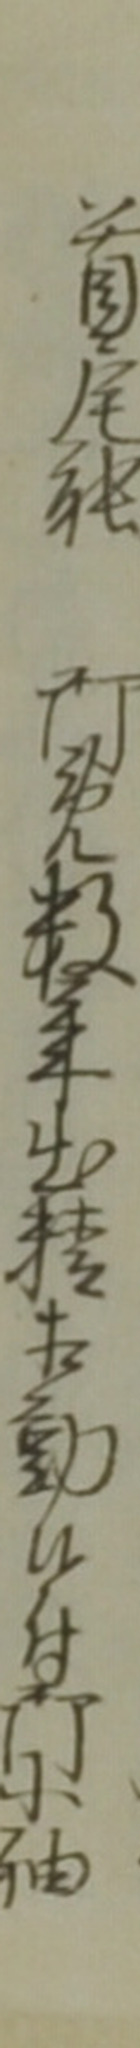首尾能御免数年出精相務候付御小袖
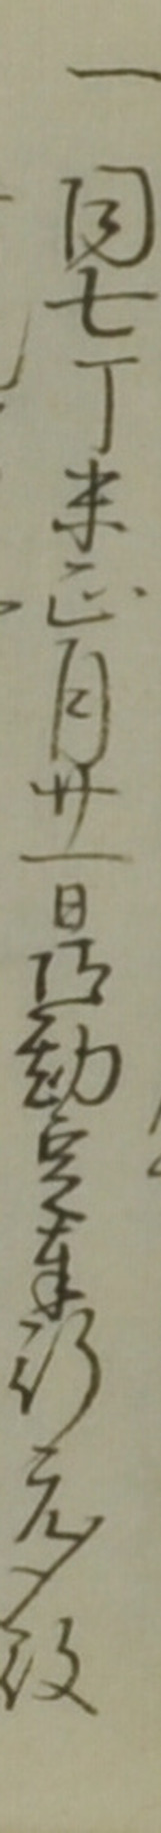一同七丁未正月廿一日御勘定奉行元〆役
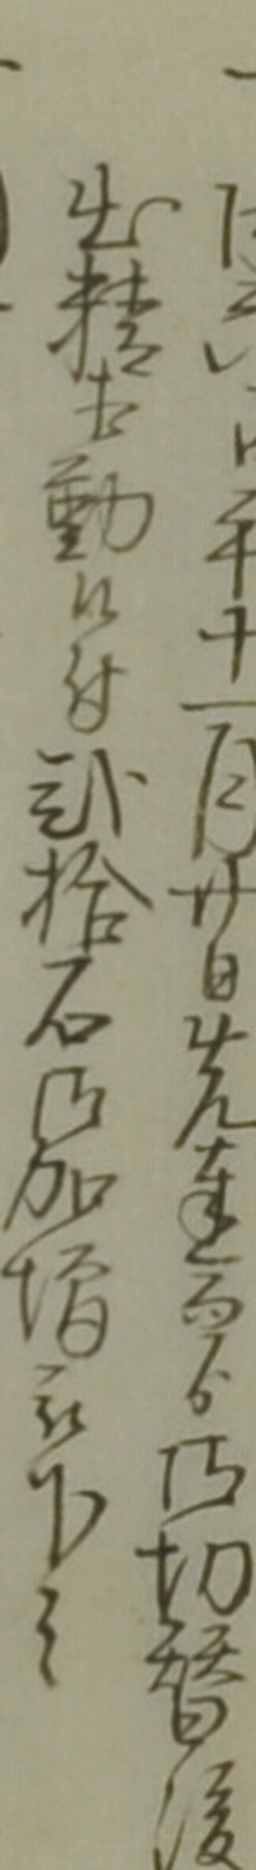出精相勤候付弐拾石御加増被下之

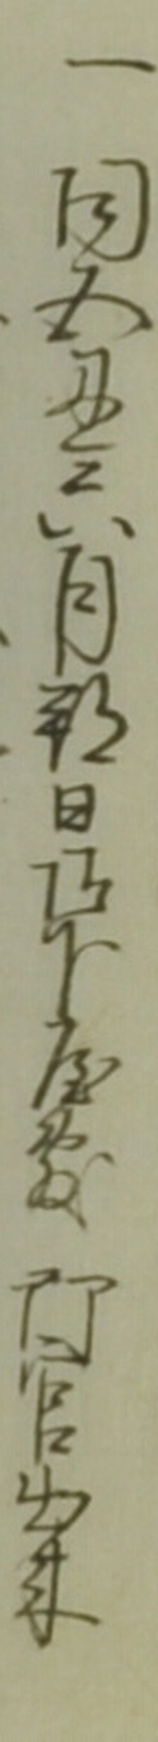一同五丑六月朔日御下屋敷御宮出来
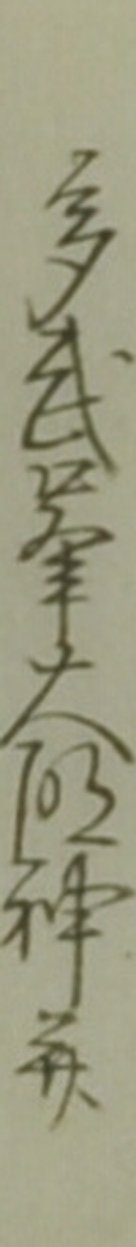多武峰大明神并
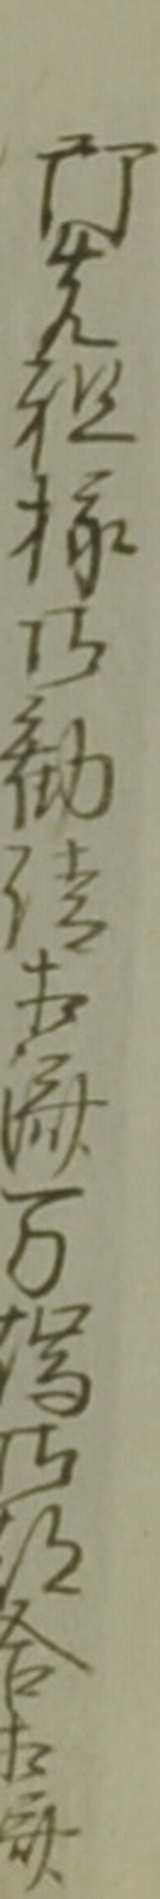御先祖様御勧請御済万端御都合相済
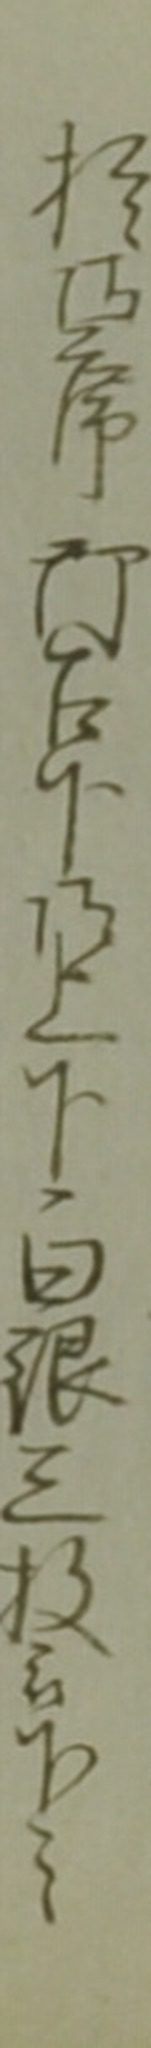於御席御召下御上下白銀三枚被成下
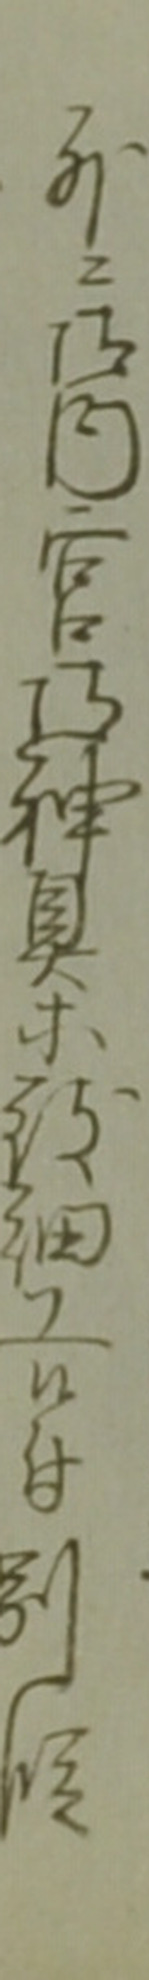外ニ御内宮御神具等致細工候付別段
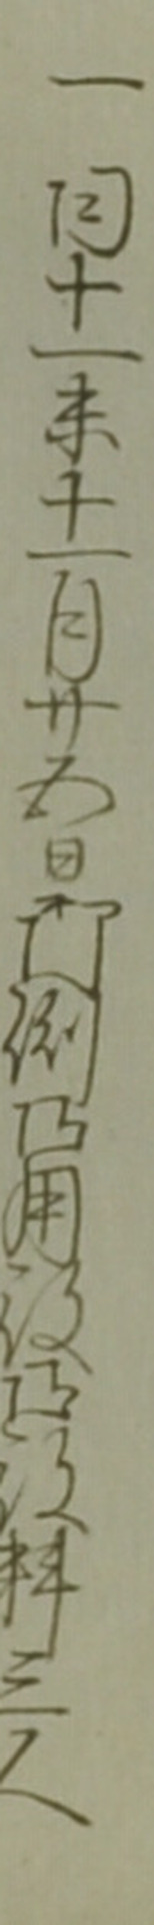一同十一未十一月廿五日御側御用役御役料三人
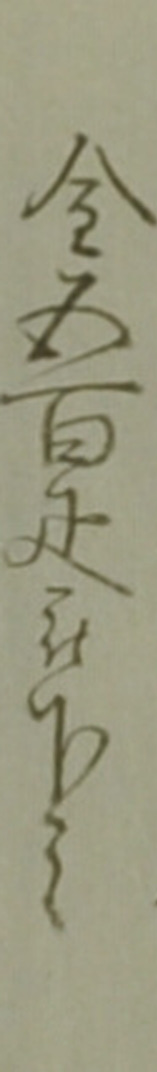金五百疋被下之
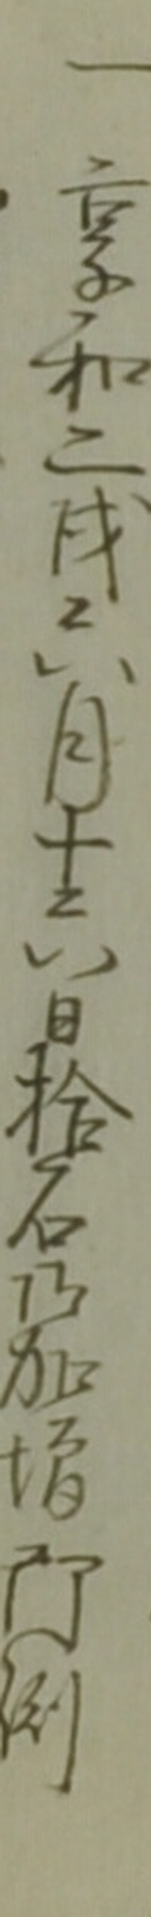一享和ニ戌六月十六日拾石御加増御側
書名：給人諸士勤仕録（三）
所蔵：伊那市立高遠町図書館・合同会社AMANE
